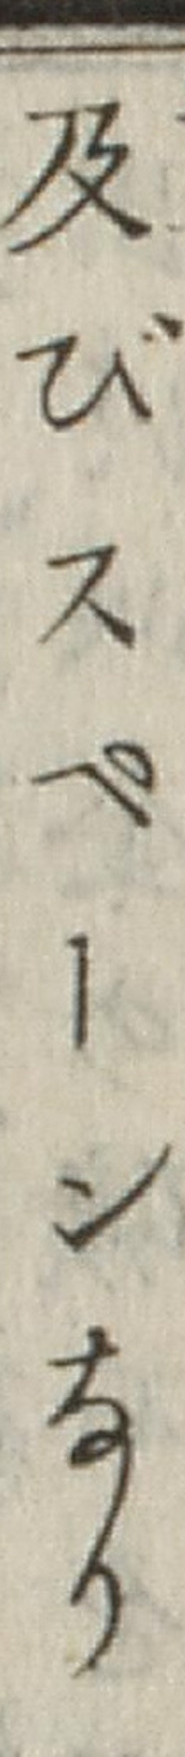及びスペーンなり
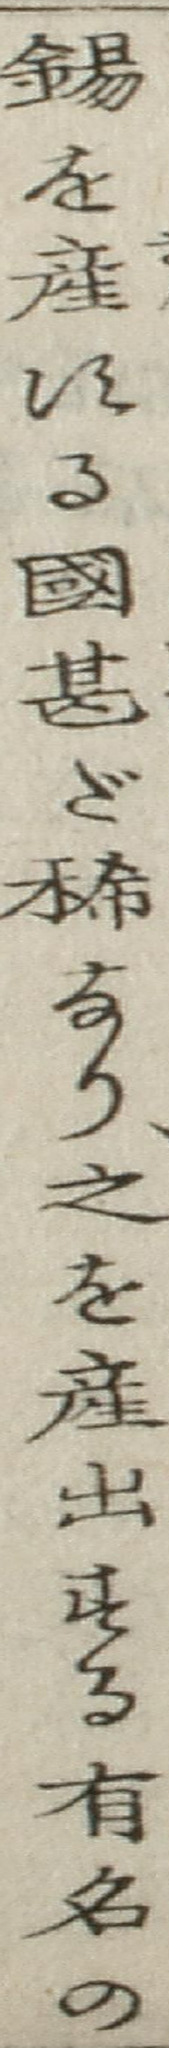錫を産する国甚だ稀なり、之を産出する有名の
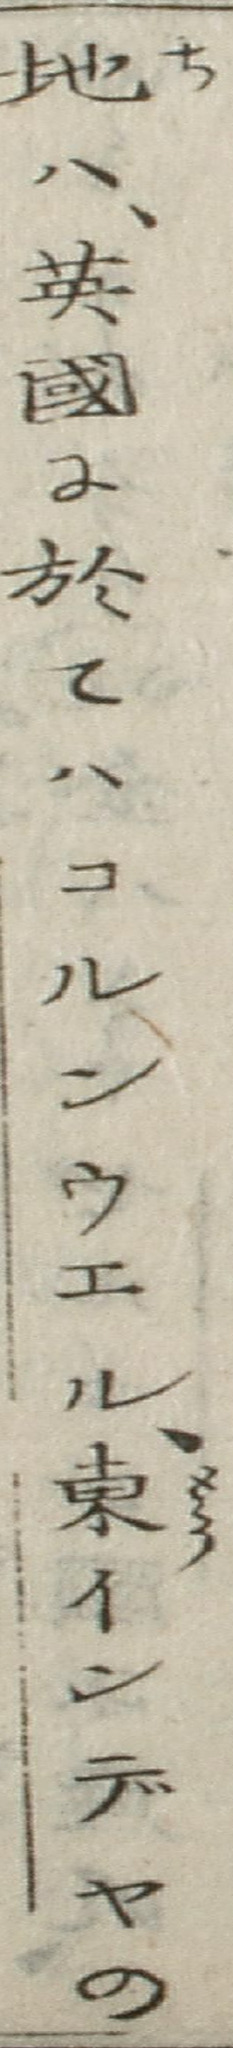地は、英国に於てハコルンウエル、東インデヤの
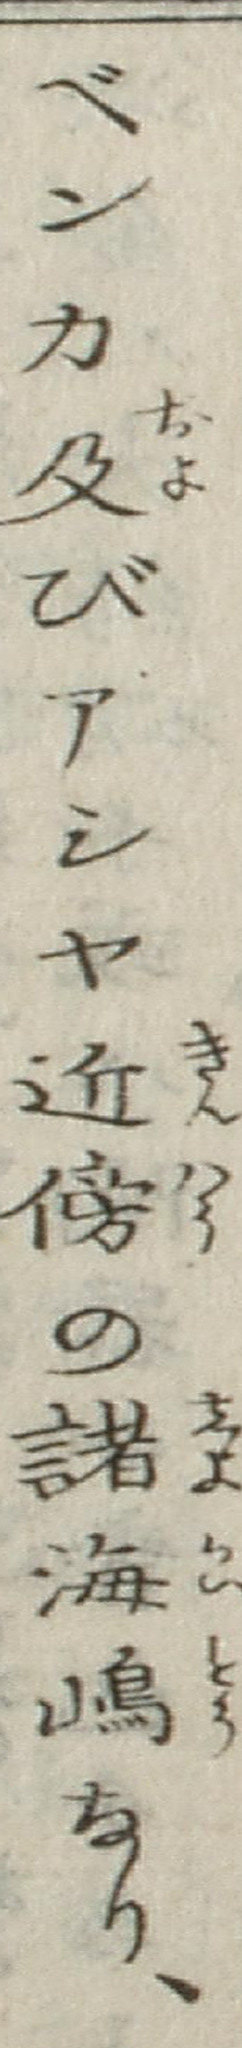ベンカ及びアシア近傍の諸海島なり、
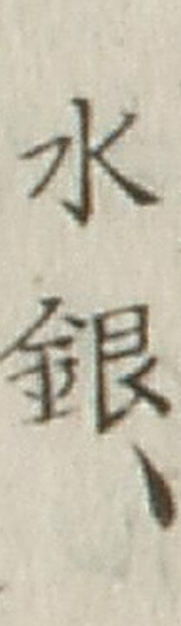水銀、
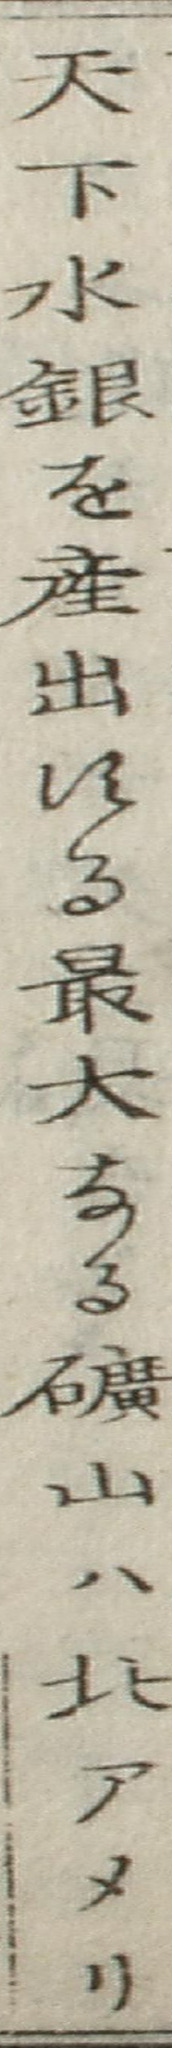天下水銀を産出する最大なる砿山は、北アメリ
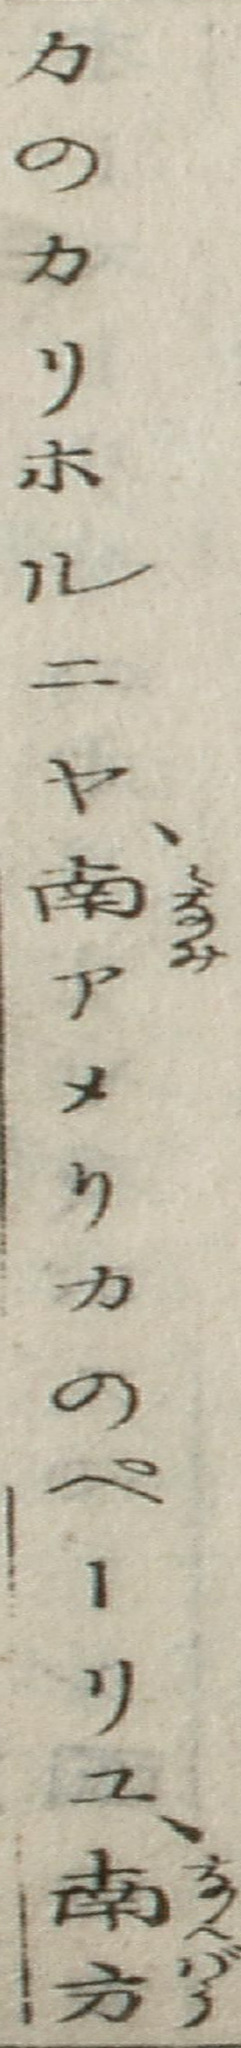カのカリホルニヤ、南アメリカのペーリユ、南方

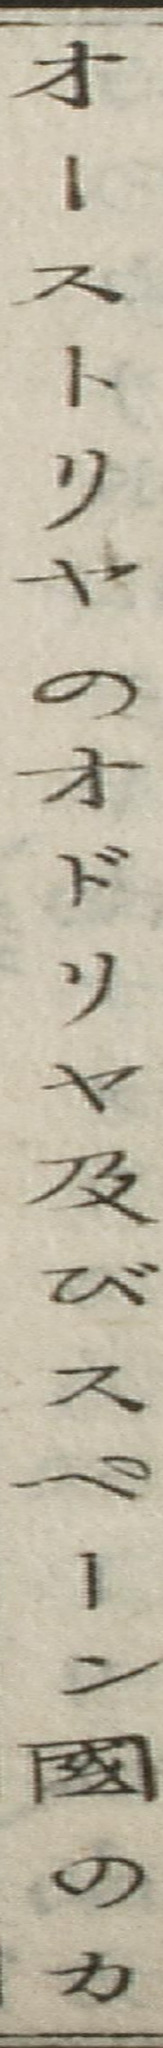オーストリヤのオドリヤ及びスペーン国のカ
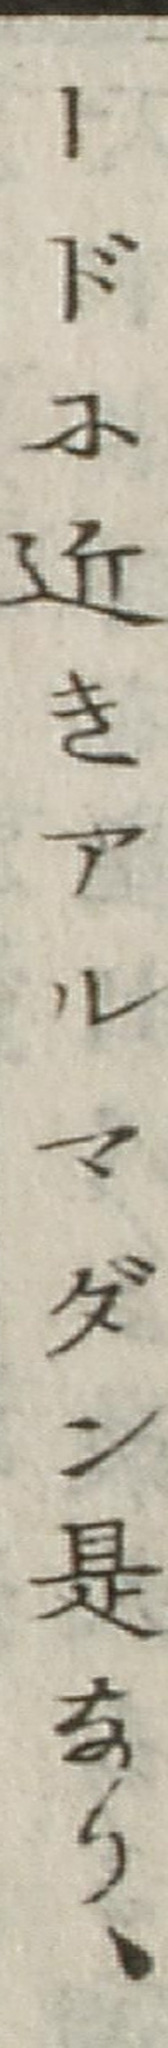ードに近きアルマダン是なり、
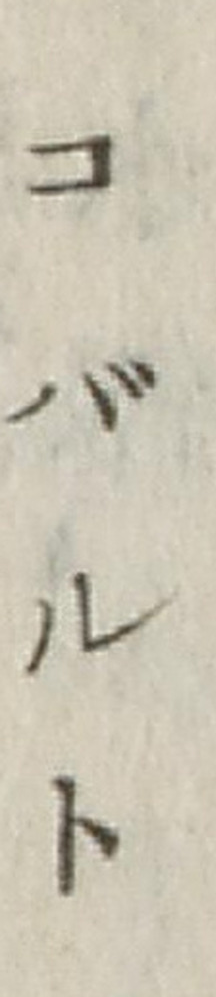コバルト
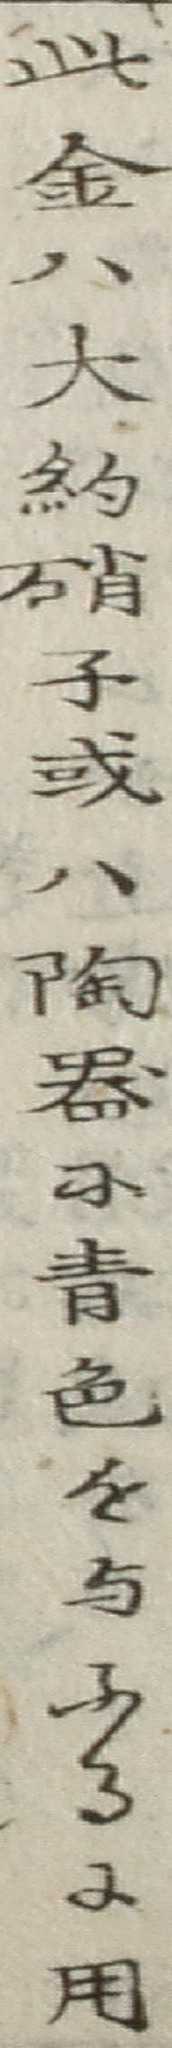此金は大約硝子或は陶器に青色を与ふるに用
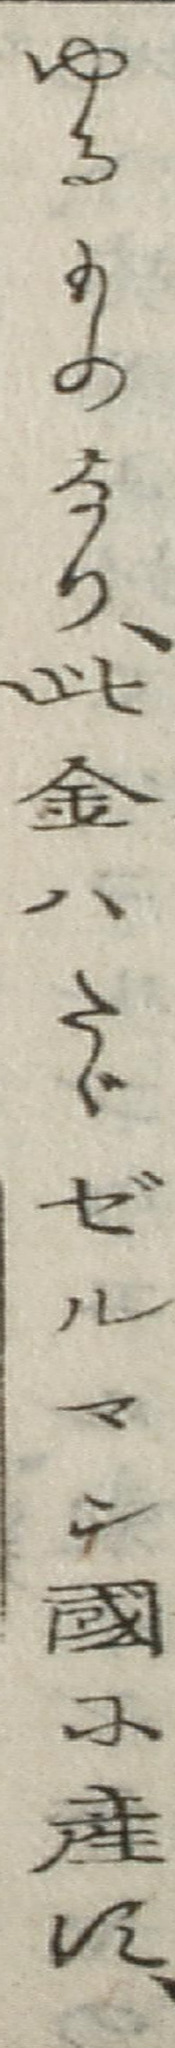ゆるものなり、此金はただゼルマン国に産す、
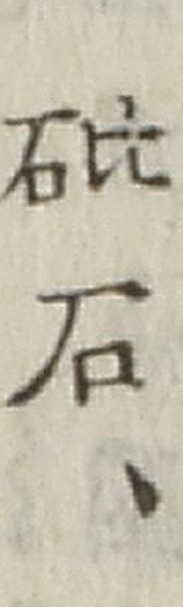砒石、
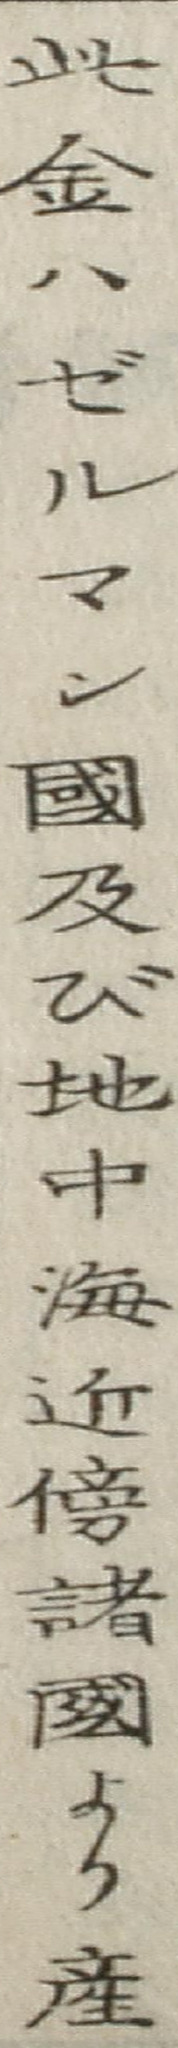此金はゼルマン国及び地中海近傍諸国より産
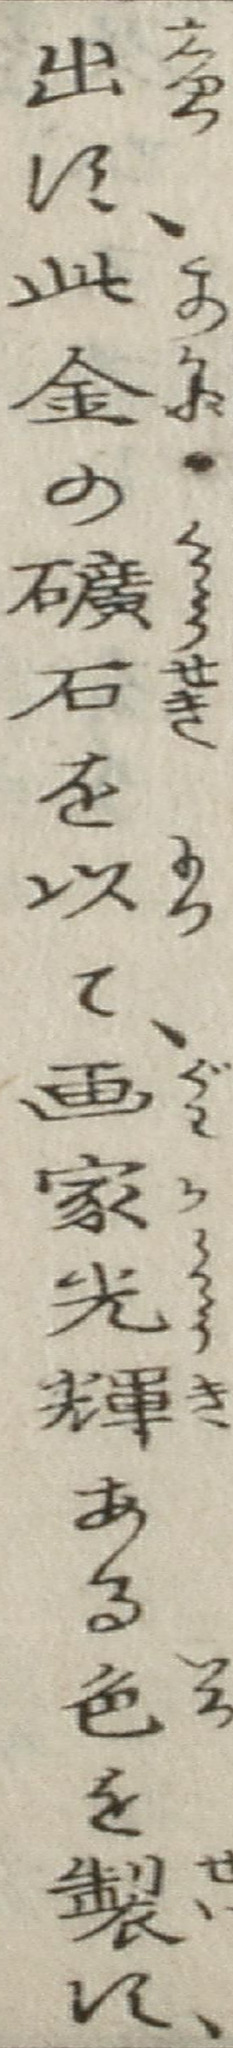出す、此金の鉱石を以て、画家光輝ある色を製す、
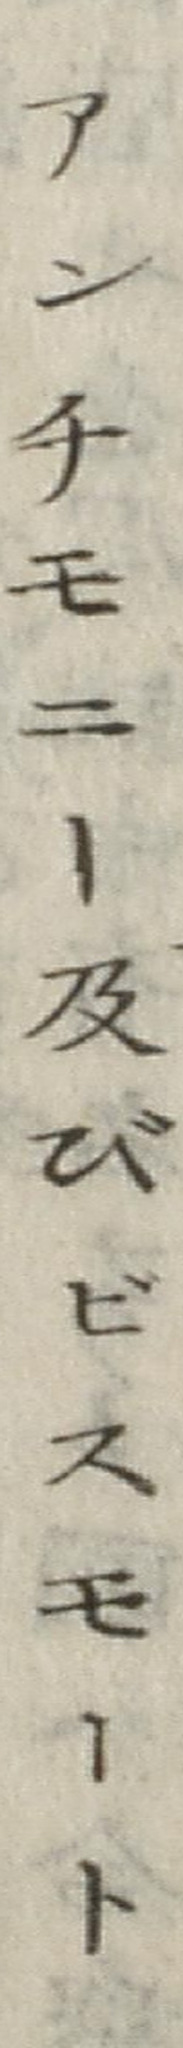アンチモニー及びビスモート
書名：訓蒙　天然地理學　下
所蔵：東京大学地震研究所図書室 Earthquake Research Institute Library, The University of Tokyo, JAPAN
